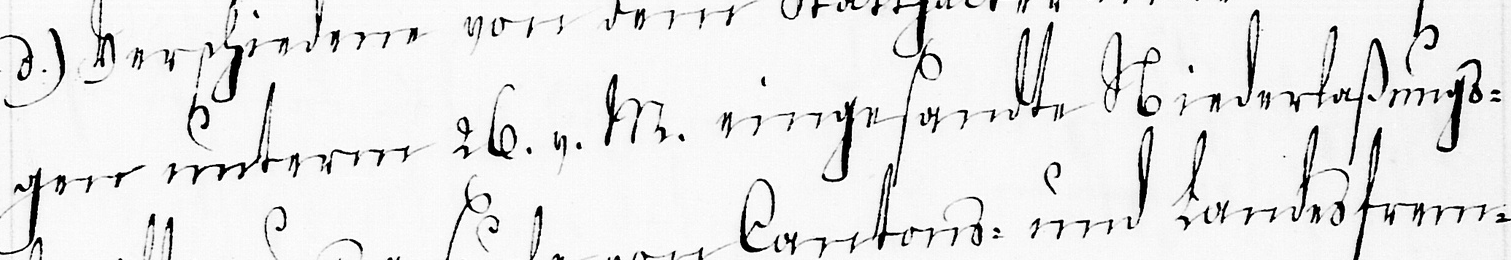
gen unterm 26. v. M. eingesandte Niederlaßungs¬
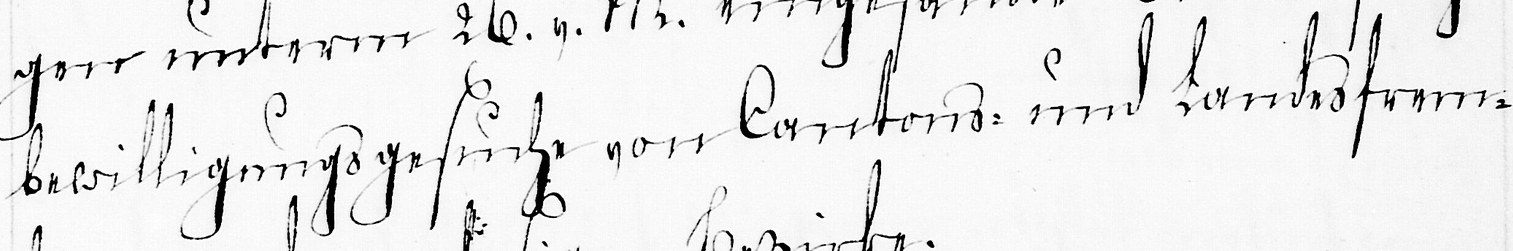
bewilligungsgesuche von Cantons- und Landesfrem¬
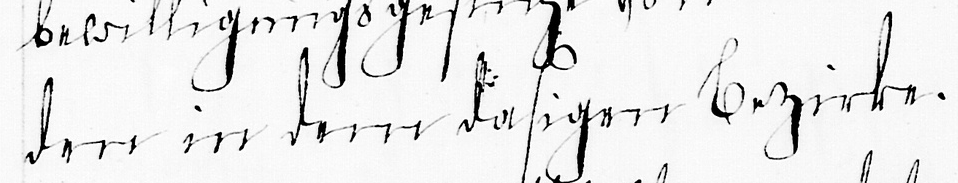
den in dem dasigen Bezirke.
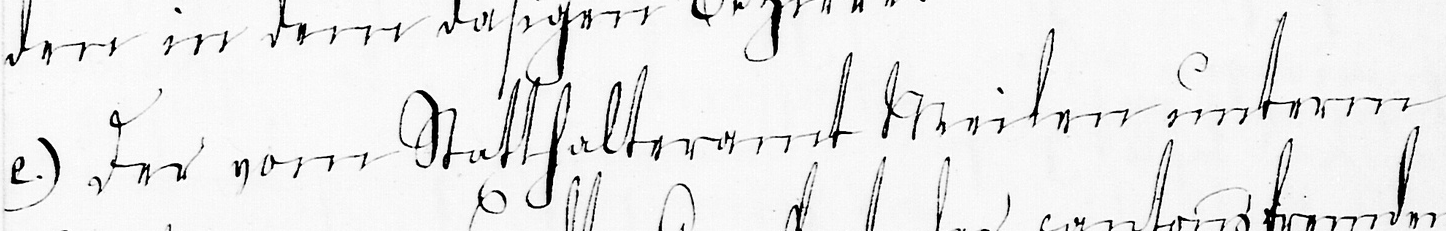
e.) Der vom Statthalteramte Meilen unterm
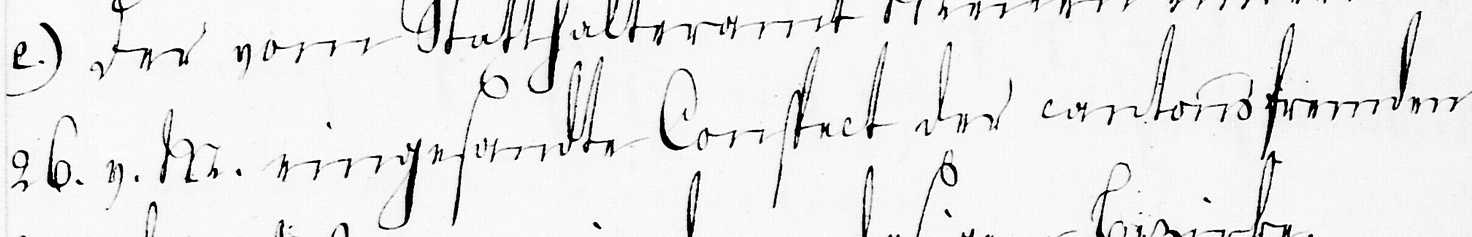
26. v. M. eingesandte Conspect der cantonsfremden
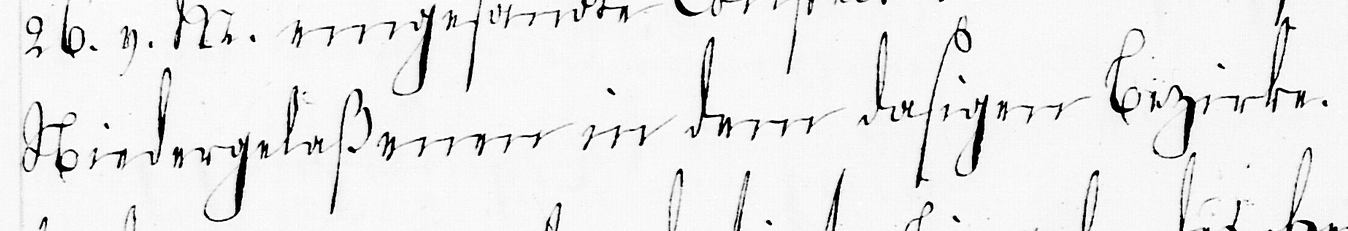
Niedergelaßenen in dem dasigen Bezirke.
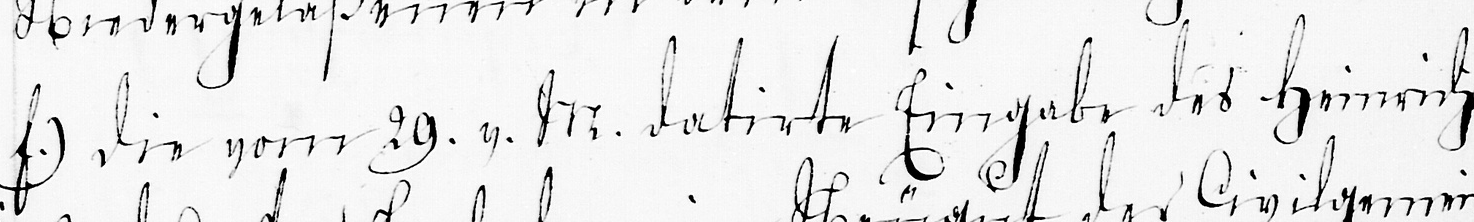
f.) die vom 29. v. M. datirte Eingabe des Heinrich
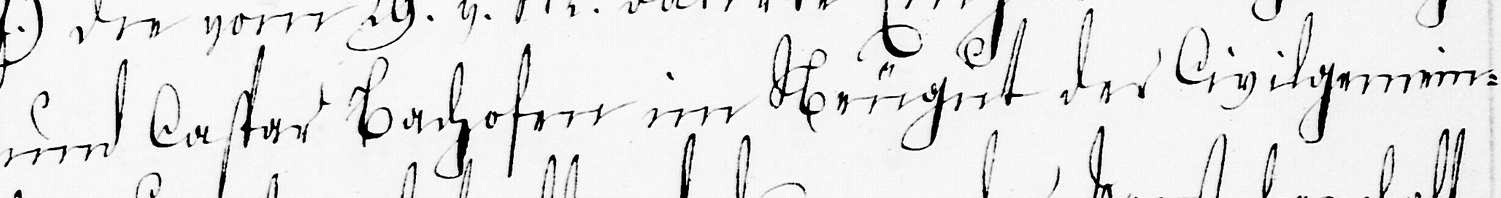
und Caspar Bachofen im Neugut der Civilgemein¬
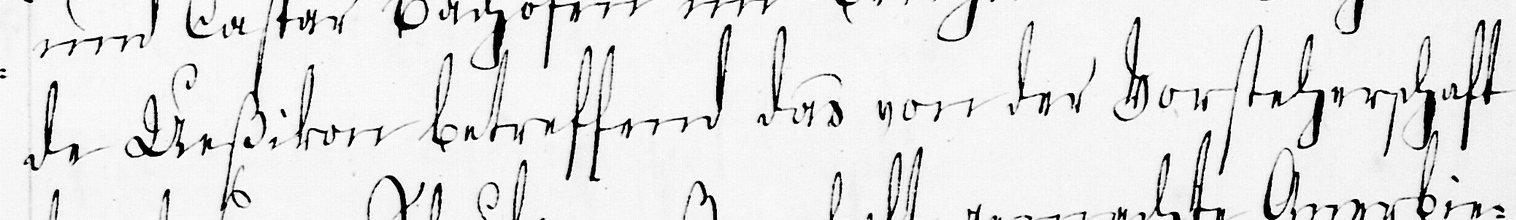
de Ueßikon betreffend das von der Vorsteherschaft
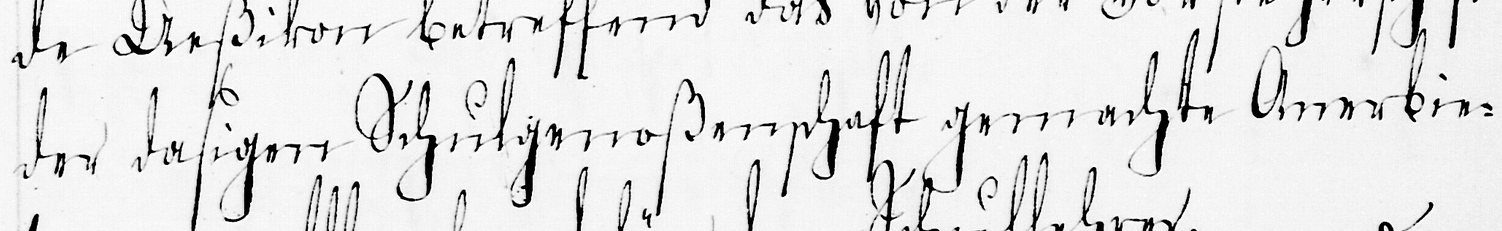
der dasigen Schulgenoßenschaft gemachte Anerbie¬
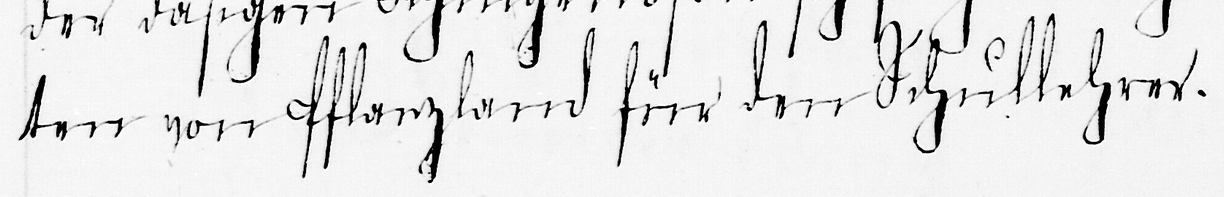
ten von Pflanzland für den Schullehrer.
